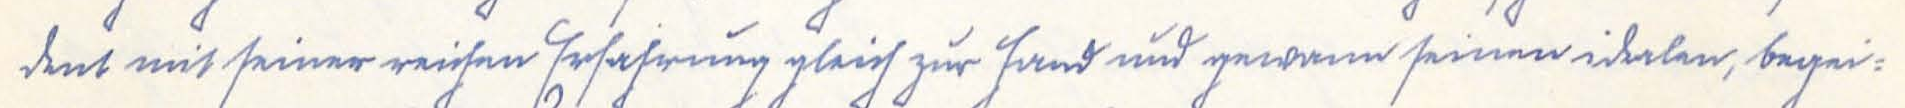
dent mit seiner reichen Erfahrung gleich zur Hand und gewann seinen idealen, begei-
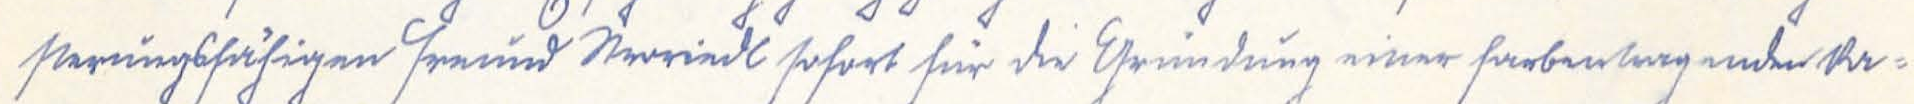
sterungsfähigen Freund Stroriedl sofort für die Gründung einer farbentragenden ka-
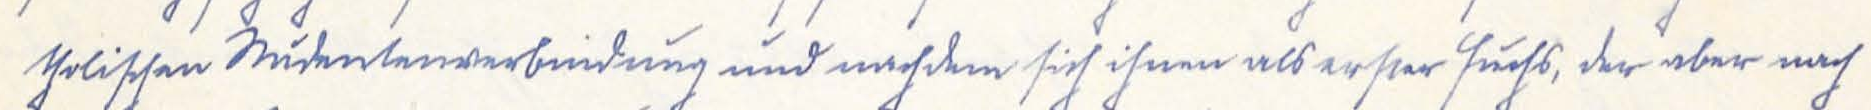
tholischen Studentenverbindung und nachdem sich ihnen als erster Fuchs, der aber nach
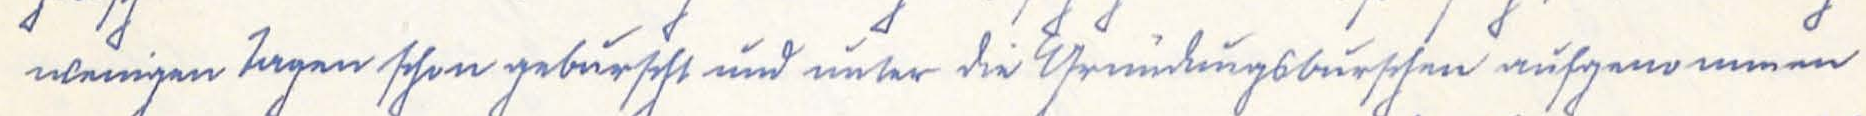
wenigen Tagen schon geburscht und unter die Gründungsburschen aufgenommen
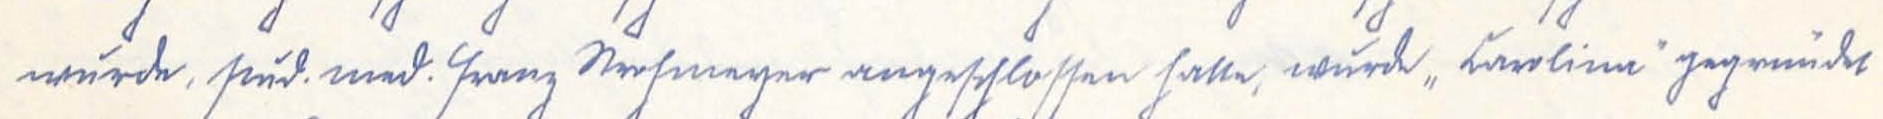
wurde, stud. med. Franz Strohmeyer angeschlossen hatte, wurde "Carolina" gegründet
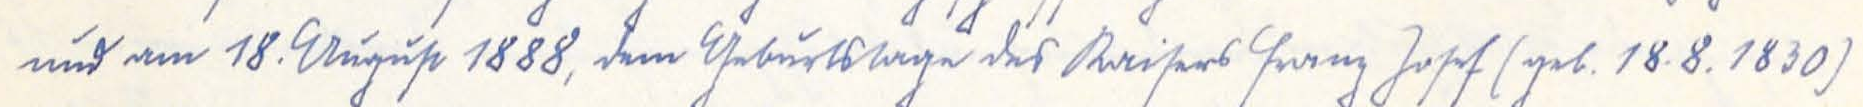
und am 18. August 1888, dem Geburtstage des Kaisers Franz Josef (geb. 18.8.1830)
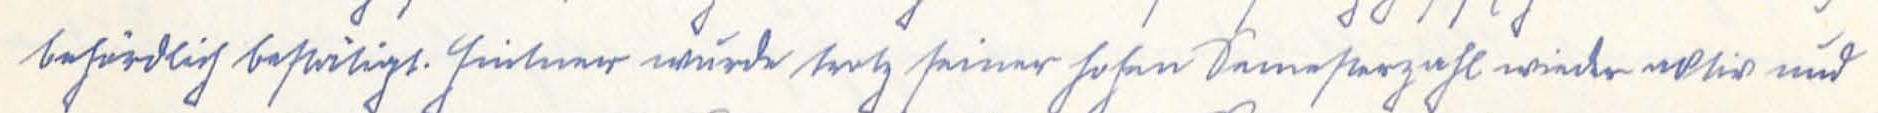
behördich bestätigt. Hintner wurde trotz seiner hohen Semesterzahl wieder aktiv und
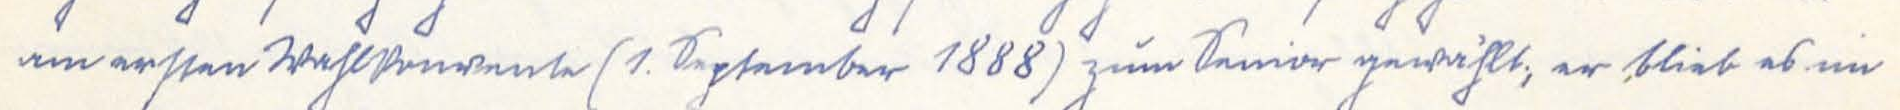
am ersten Wahlconvente (1. September 1888) zum Senior gewählt, er blieb es im
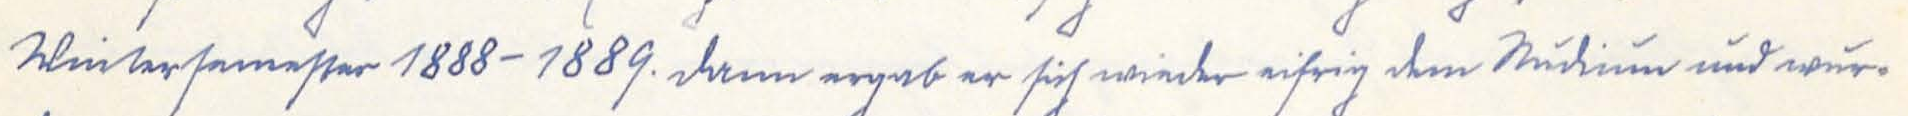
Wintersemester 1888-1889. Dann ergab er sich eifrig dem Studium und wur-
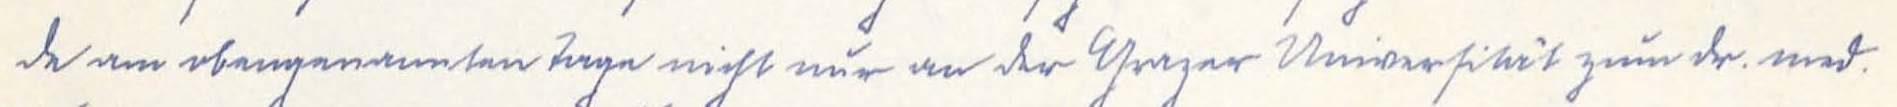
de am obengenanntem Tage nicht nur an der Grazer Universität zum Dr. med.
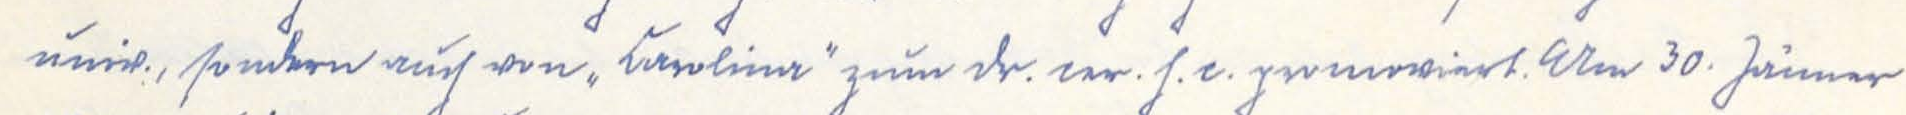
univ., sondern auch von "Carolina" zum Dr. cer. h.c. promoviert. Am 30. Jänner
